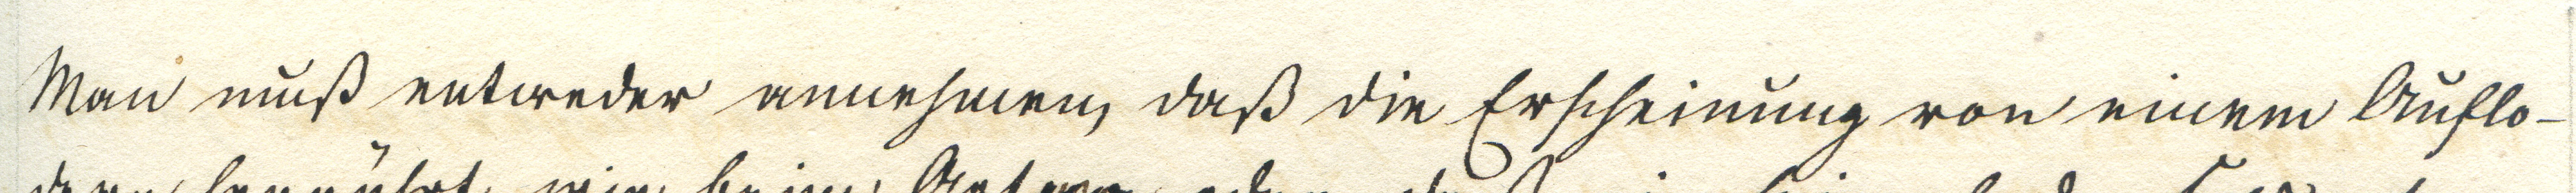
Man muß entweder annehmen, daß die Erscheinung von einem Auflo-
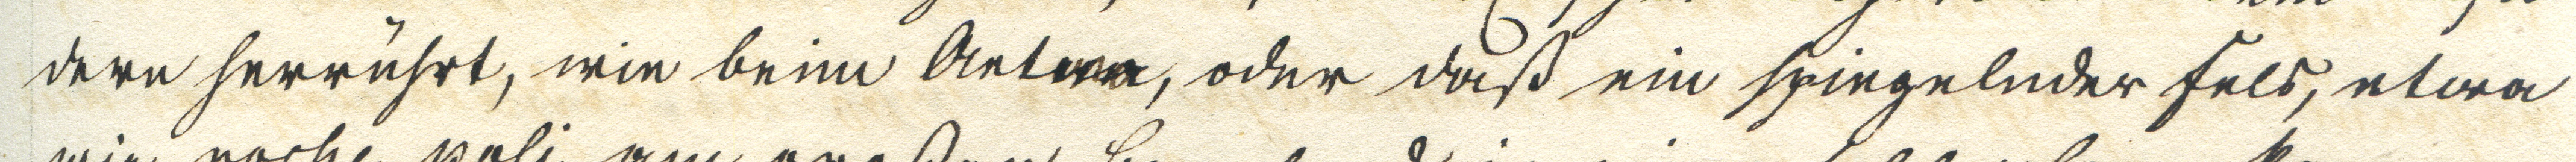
dern herrührt, wie beim Aetna, oder daß ein spiegelnder Fels, etwa
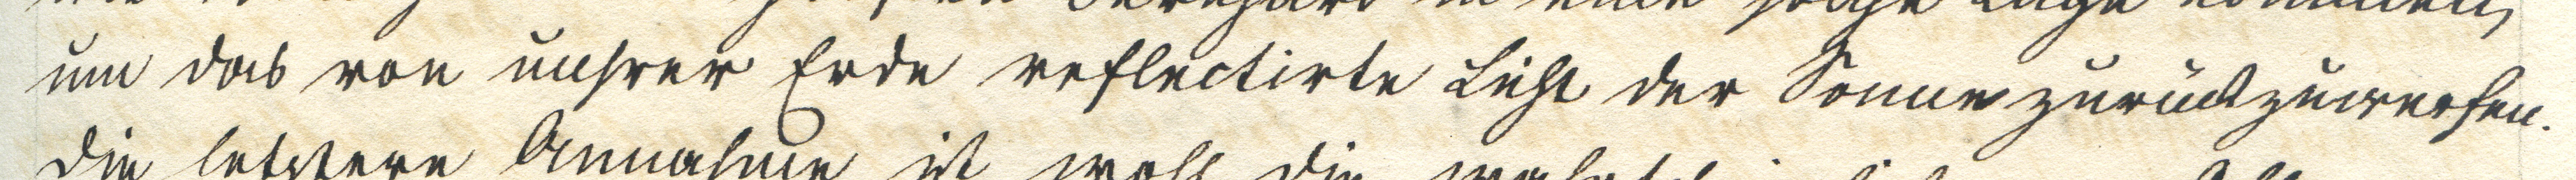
um das von unsrer Erde reflectirte Licht der Sonne zurückzuwerfen.
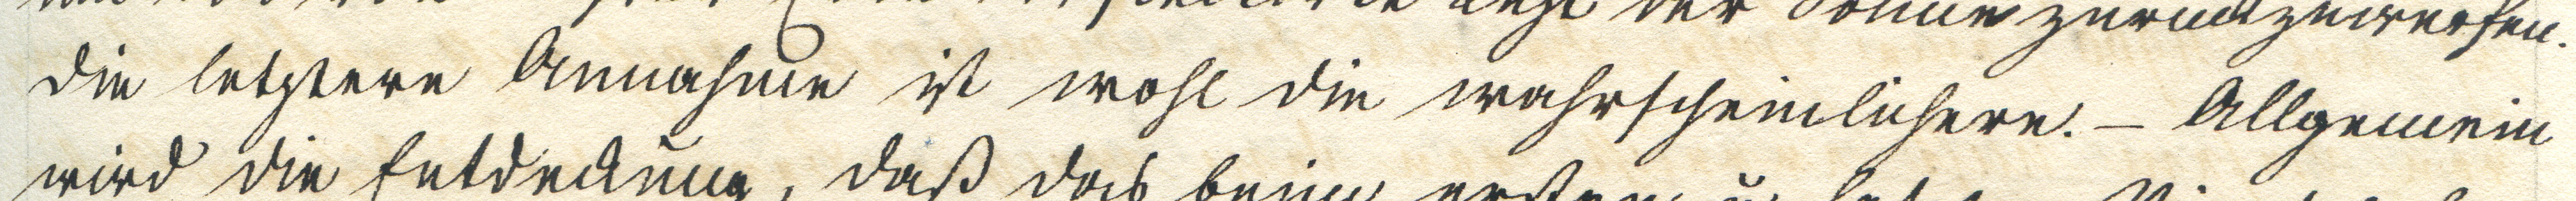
Die letztere Annahme ist wohl die wahrscheinlichere. – Allgemein
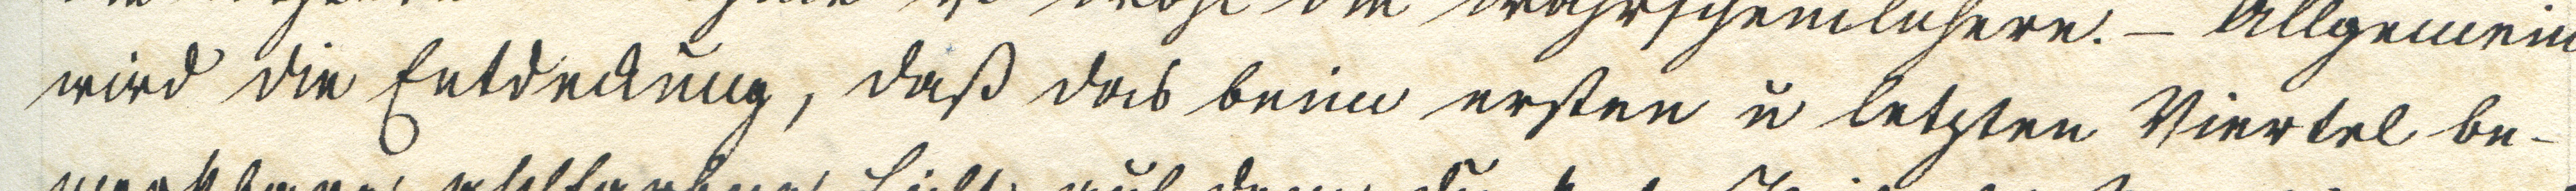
wird die Entdeckung, daß das beim ersten u letzten Viertel be-
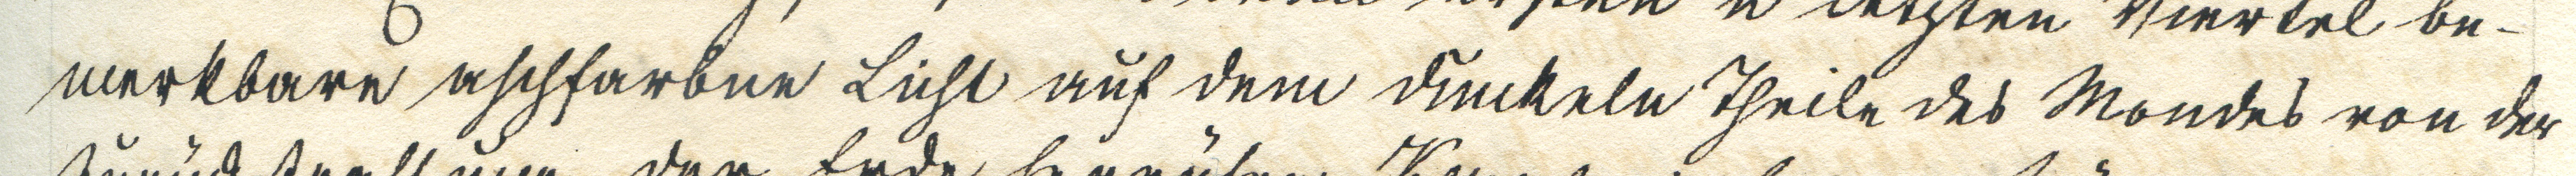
merkbare aschfarbne Licht auf dem dunkeln Theile des Mondes von der
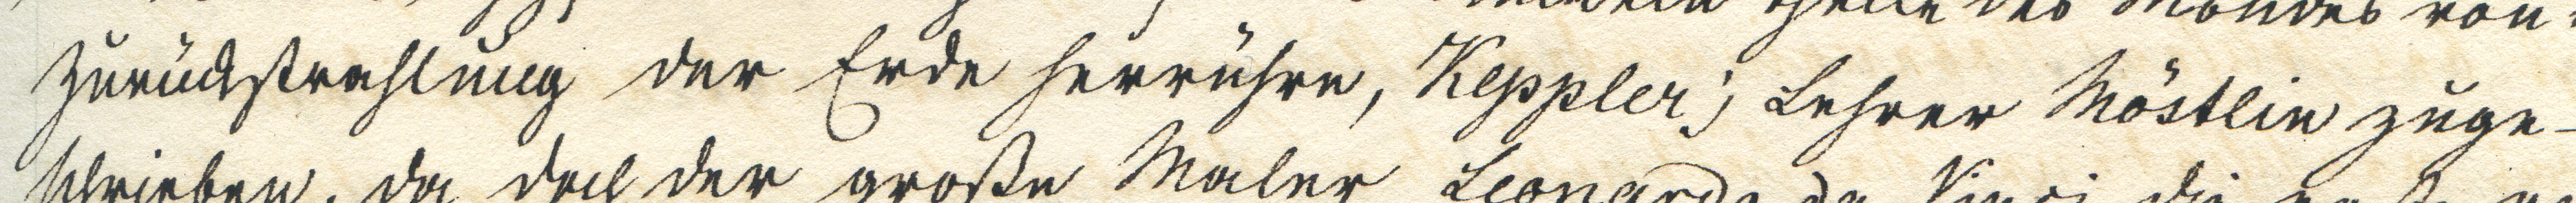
Zurückstrahlung der Erde herrühre, Keppler’s Lehrer Möstlin zuge-
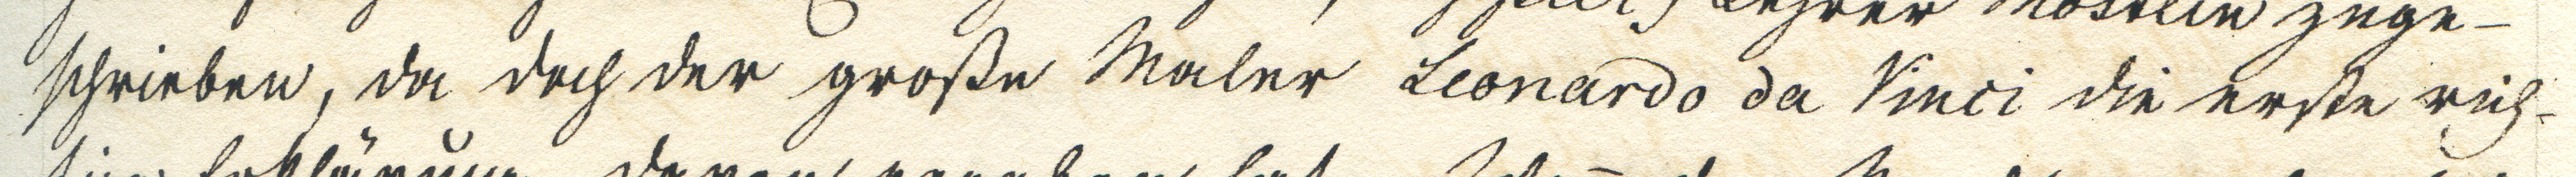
schrieben, da doch der große Maler Leonardo da Vinci die erste rich-
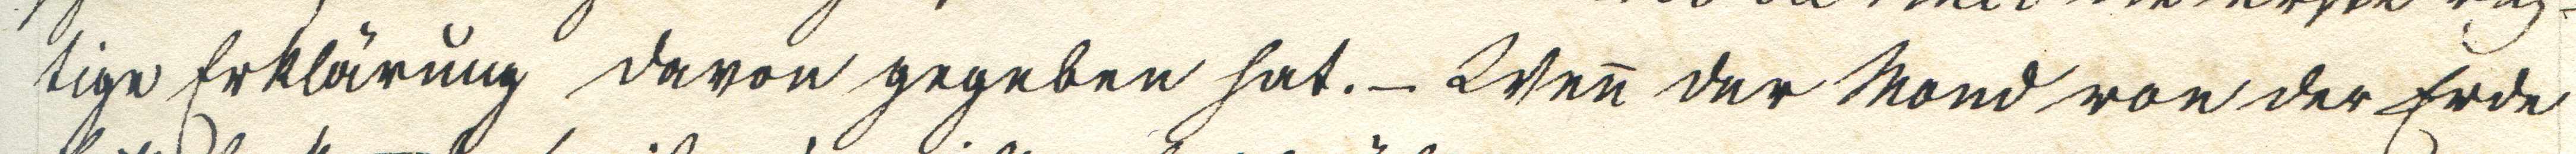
tige Erklärung davon gegeben hat. – Weñ der Mond von der Erde
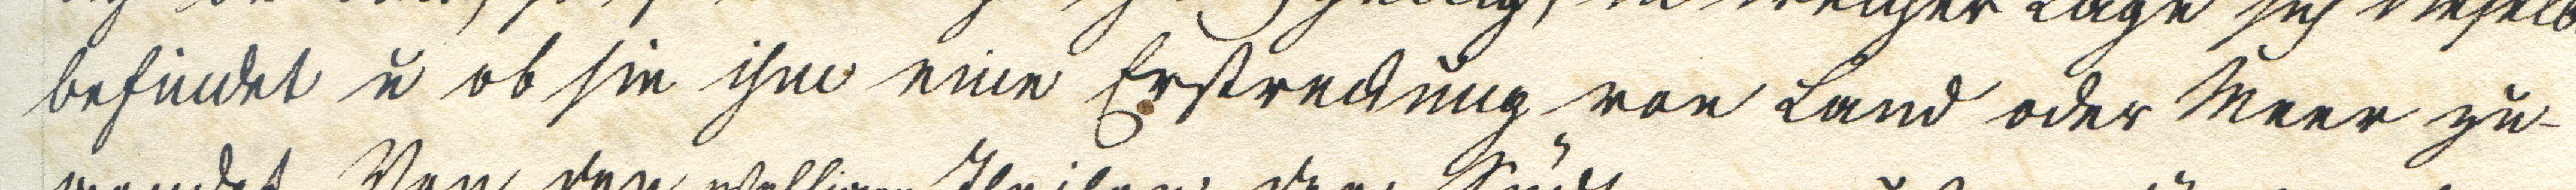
befindet u ob sie ihm eine Erstreckung von Land oder Meer zu-
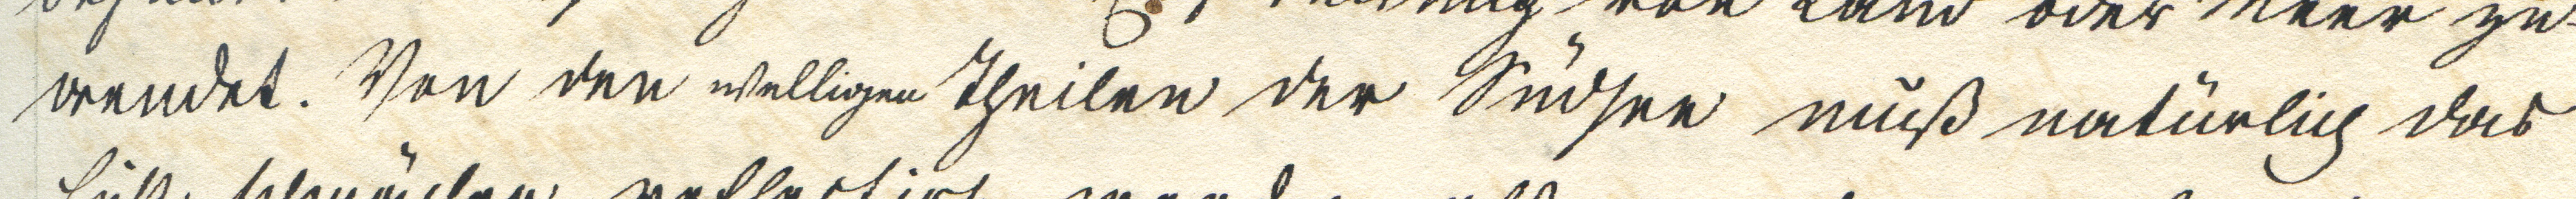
wendet. Von den welligen Theilen der Südsee muß natürlich das
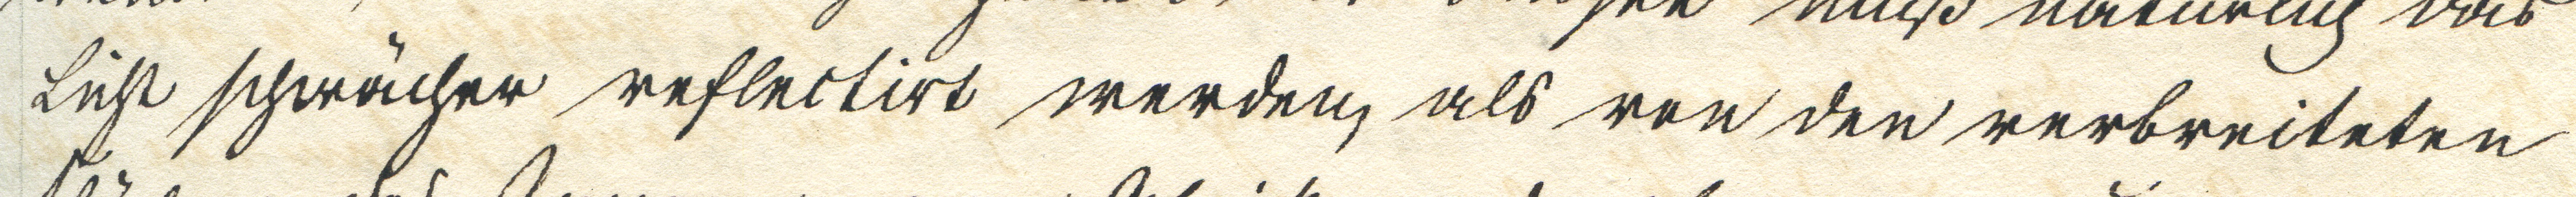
Licht schwächer reflectirt werden, als von den verbreiteten
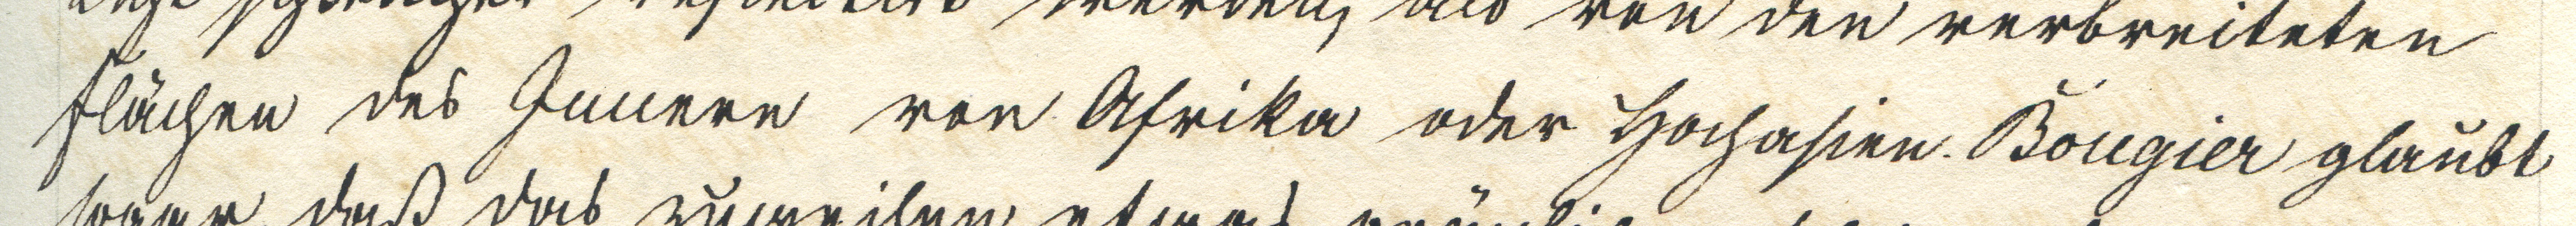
Flächen des Innern von Afrika oder Hochasien. Bouguer glaubt
